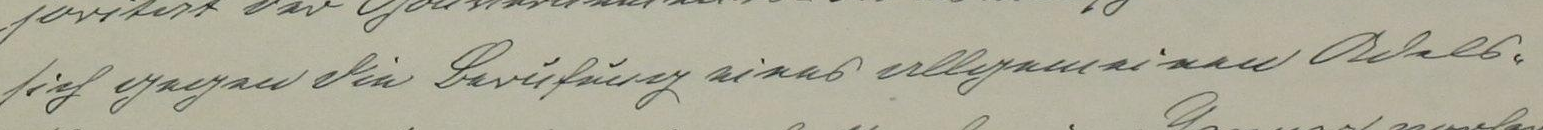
sich gegen die Berufung eines allgemeinen Adels-
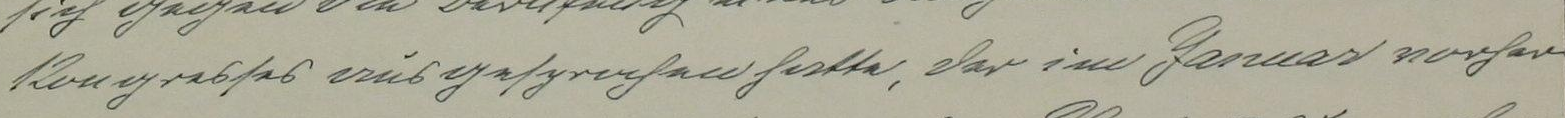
kongresses ausgesprochen hatte, der im Januar vorher
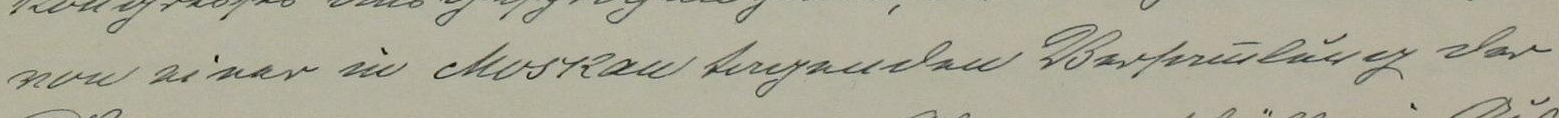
von einer in Moskau tagenden Versammlung der
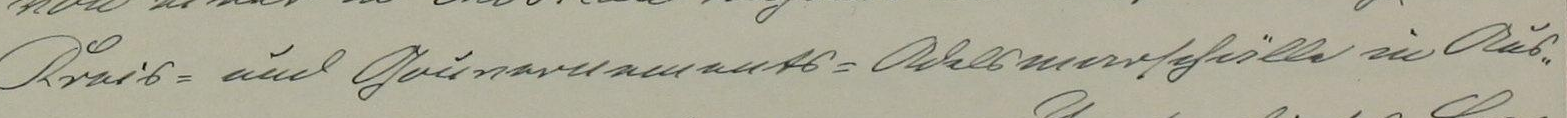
Kreis- und Gouvernements-Adelsmarschälle in Aus-
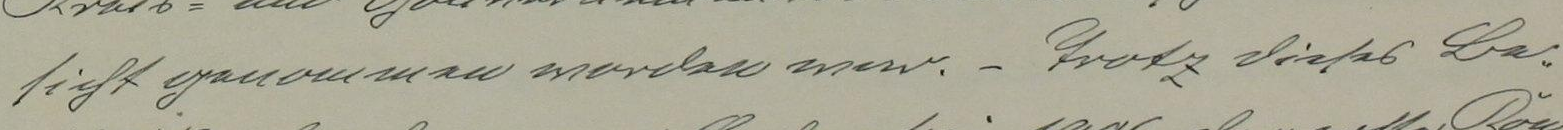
sicht genommen worden war. – Trotz dieses Be-
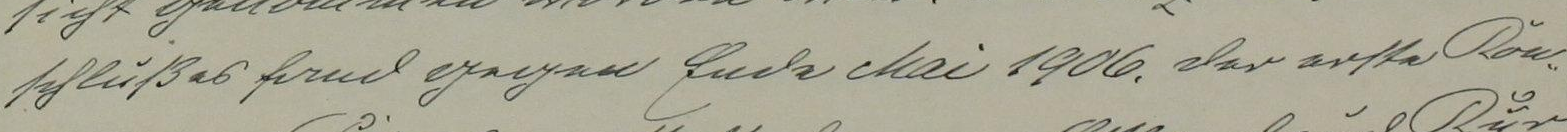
schlußes fand gegen Ende Mai 1906. der erste Kon-
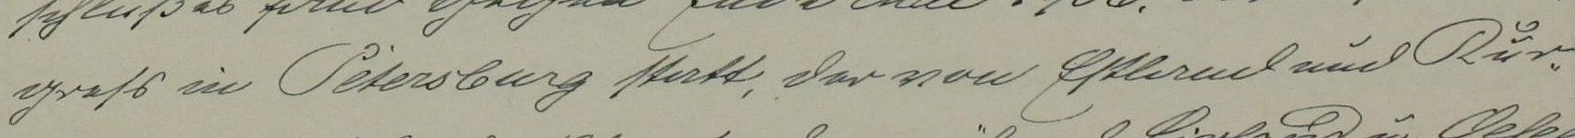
gress in Petersburg statt, der von Estland und Kur-
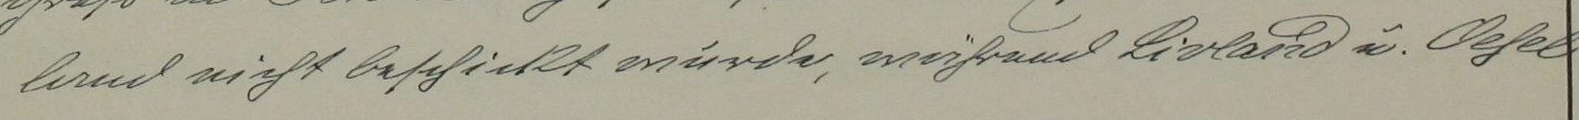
land nicht beschickt wurde, während Livland u. Oesel
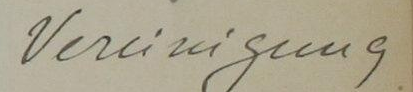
Vereinigung
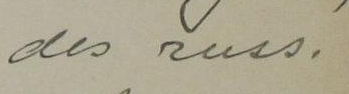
des russ.
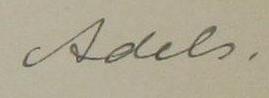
Adels
